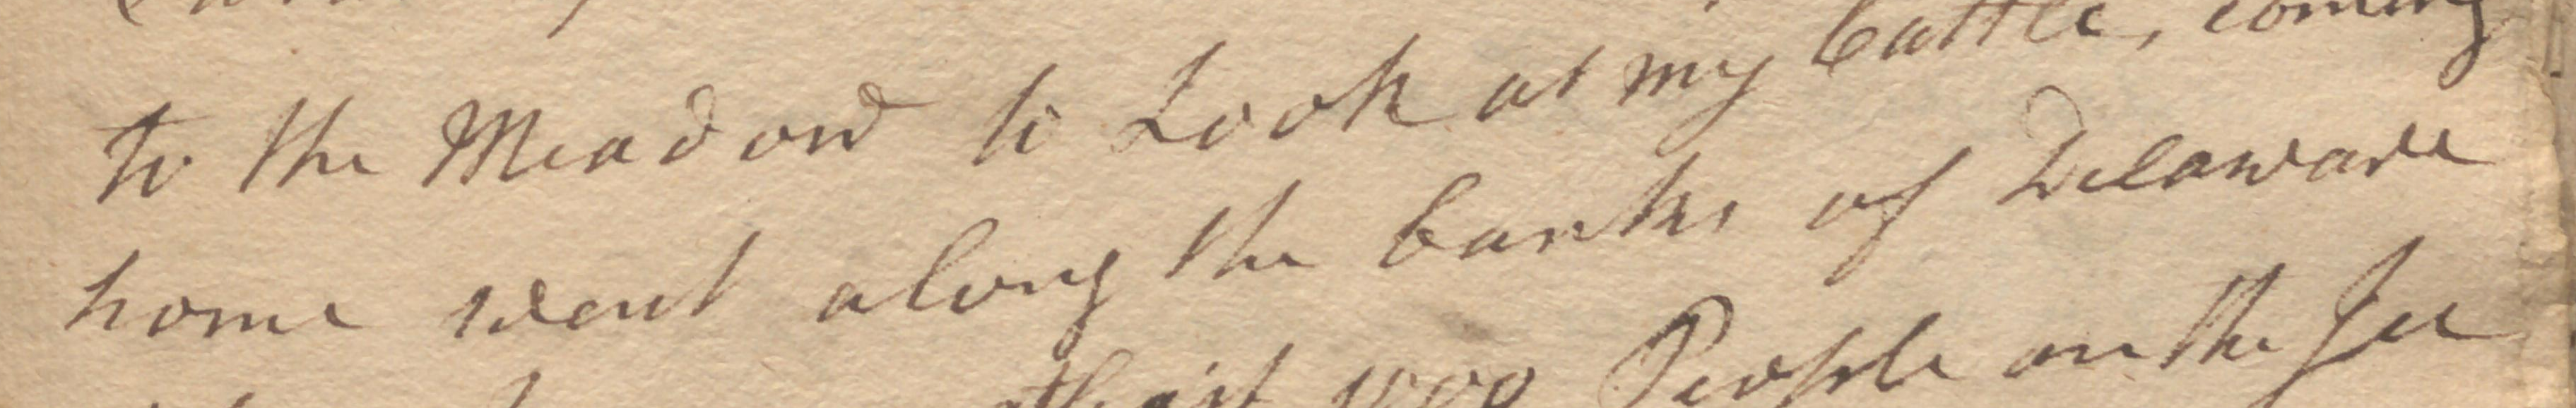home went along the banks of Delaware
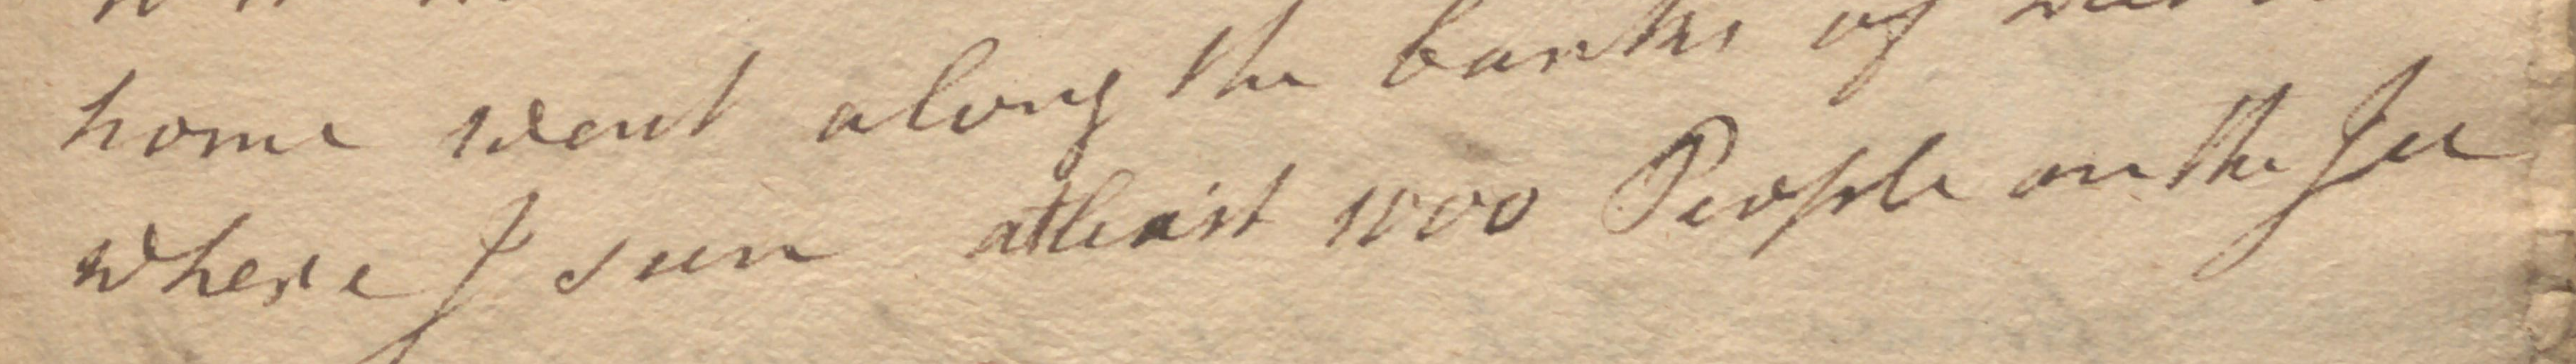where I seen at least 1000 People on the Ice
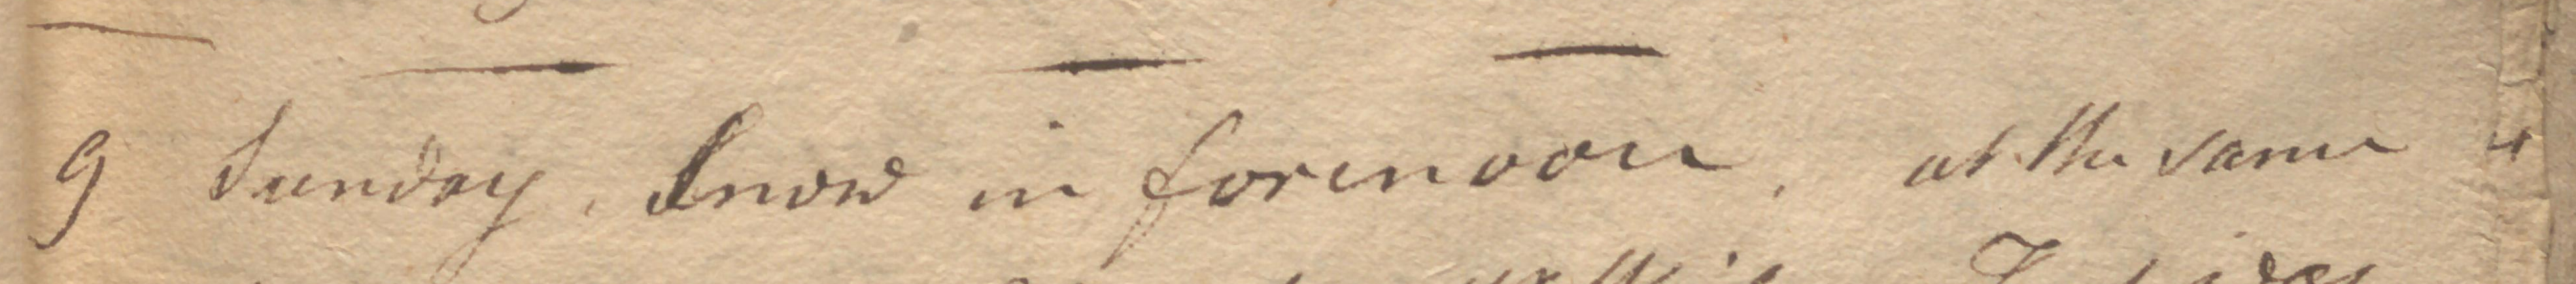9 Sunday Snow in forenoon, at the same
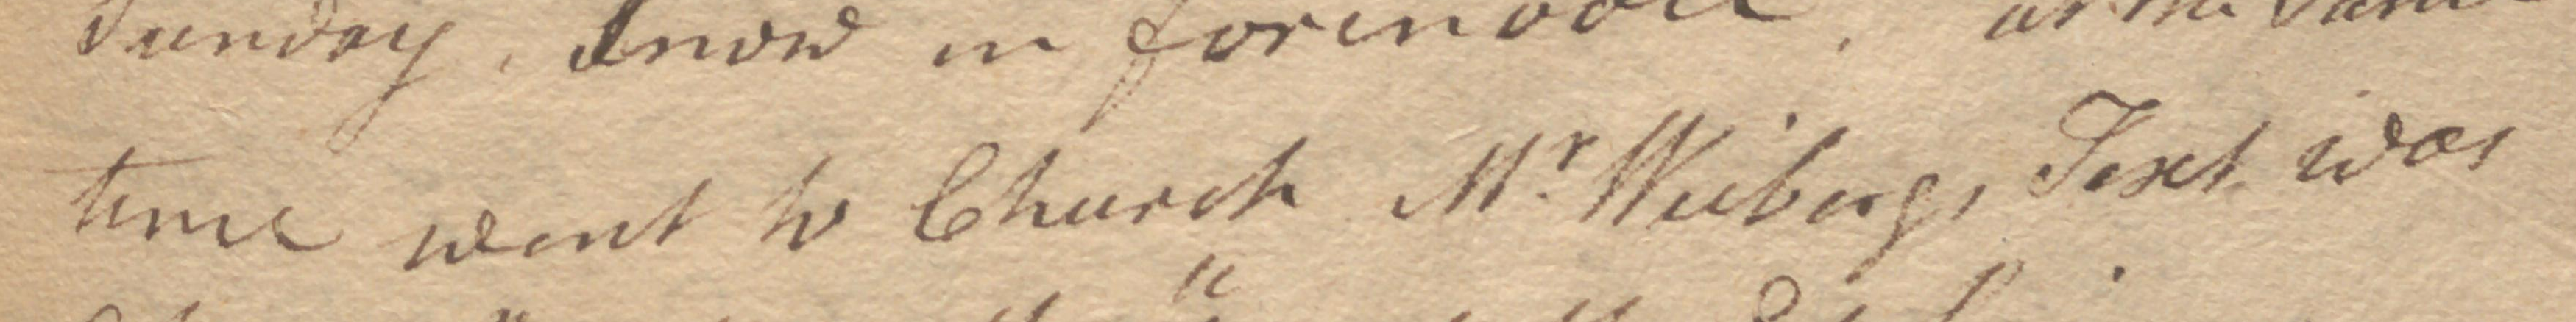time went to Church M^r. Weibergs Text was
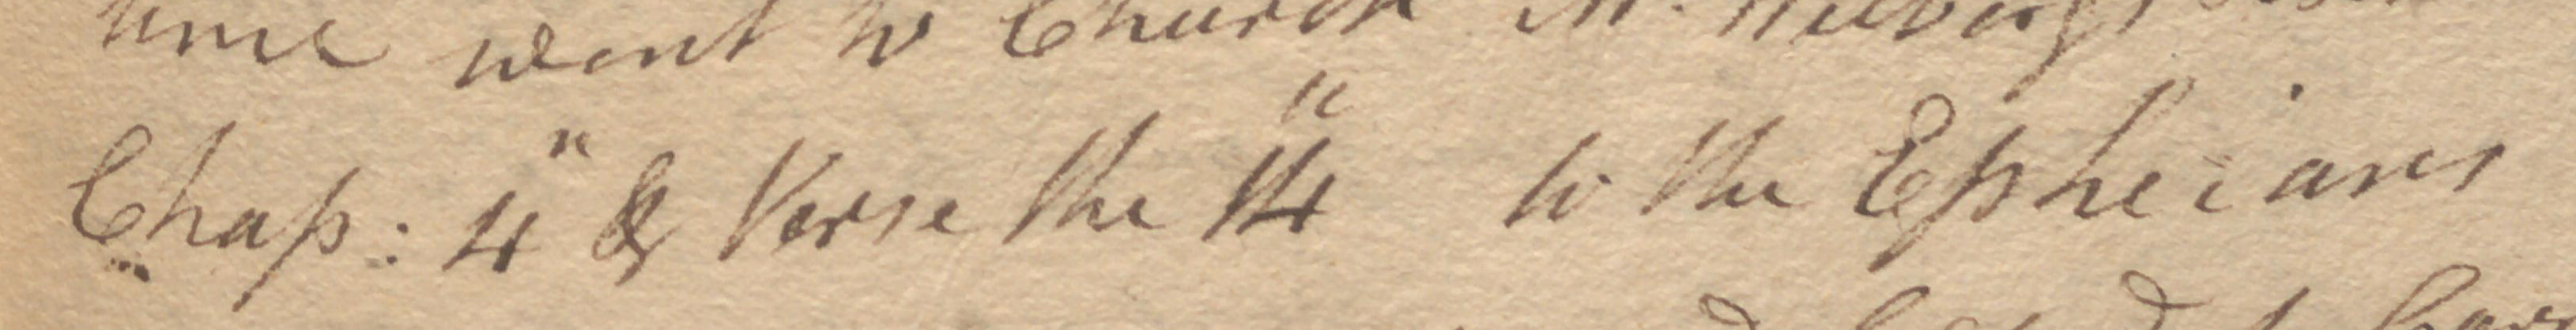Chap: 41^th & Verse the 14^th to the Epheianes
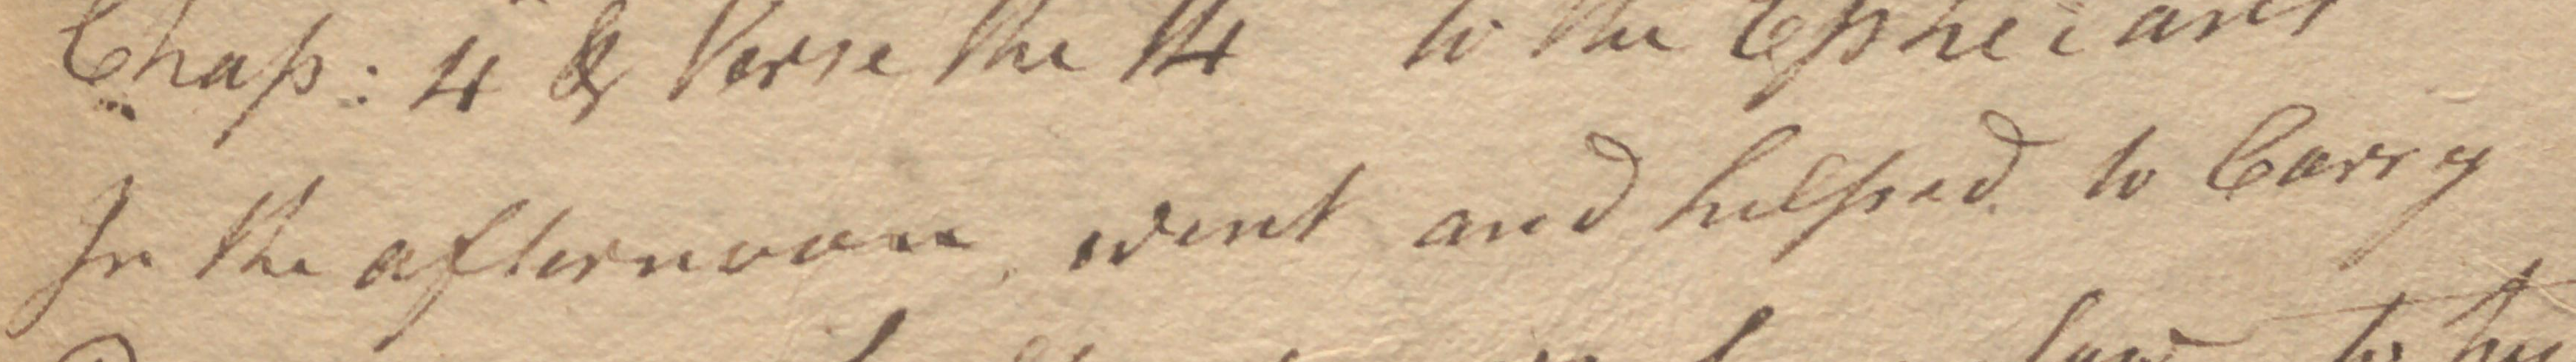In the afternoon went and helped to Carry
